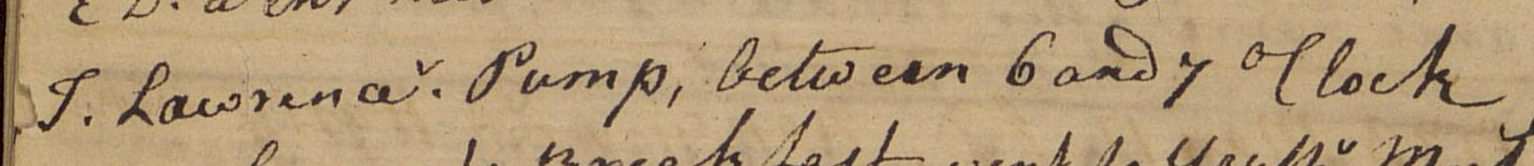S. Lawrence^s. Pump, between 6 and 7 oClock
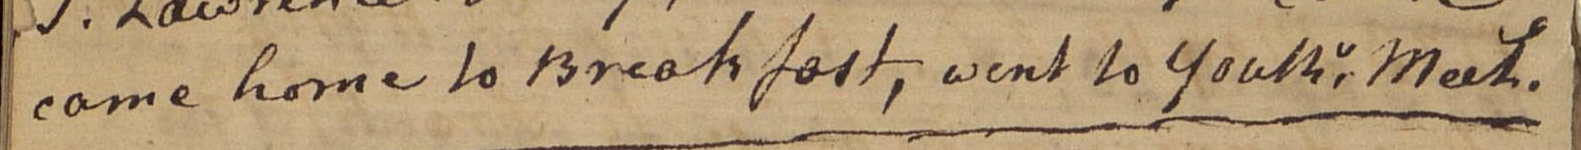came home to Breakfast, went to Youth^s Meet^g.
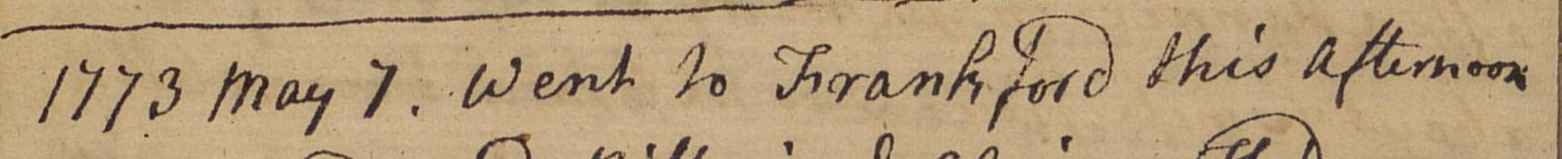1773 May 7. Went to Frankford this Afternoon
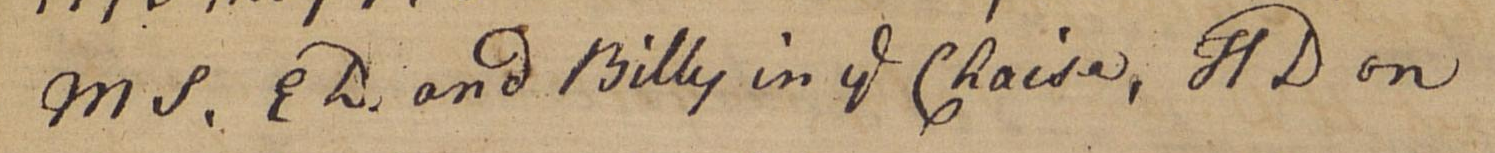MS, ED. and Billy in y^e Chaise, HD on
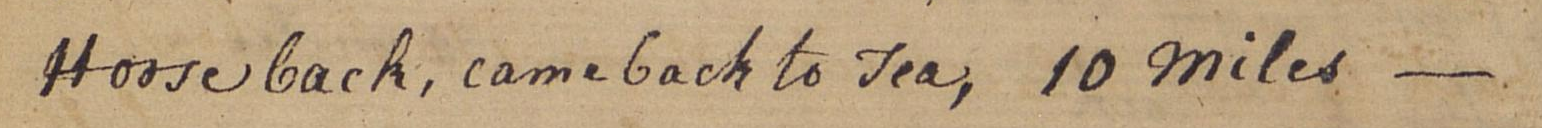Horse back, came back to Tea, 10 miles-
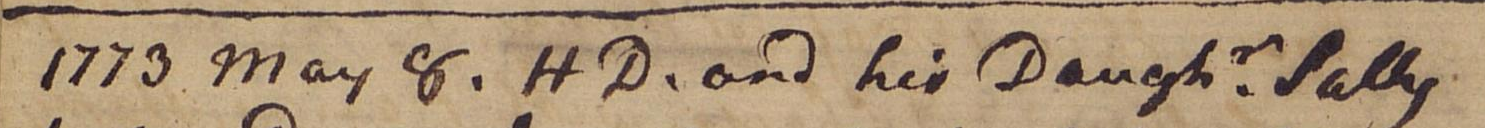1773 May 8. HD. and his Daugh^r. Sally
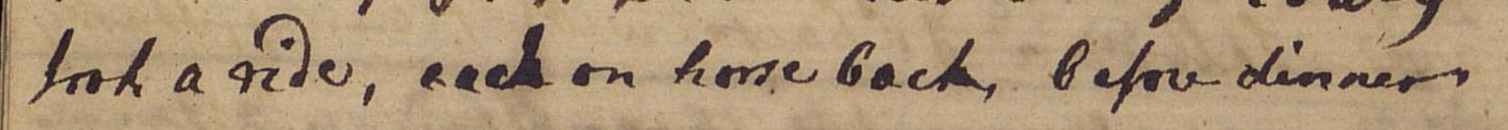took a ride, each on horse back & before dinner
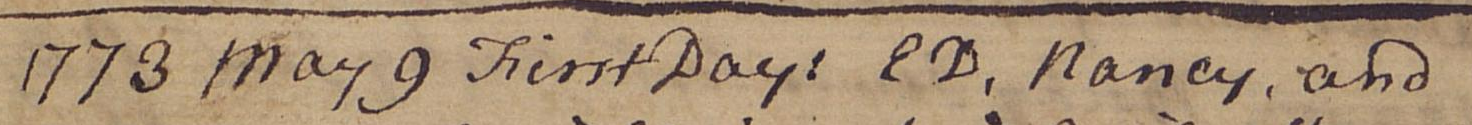1773 May 9 First Day: ED. Nancy, and
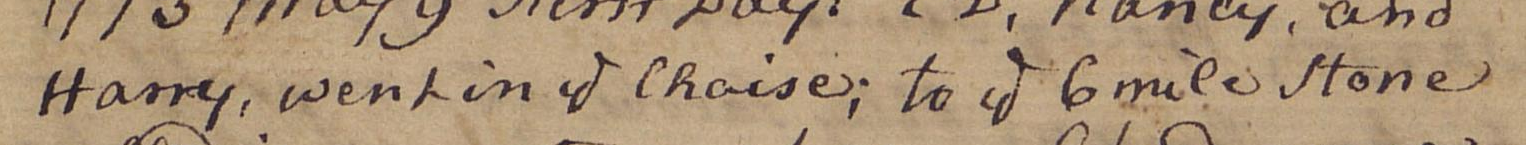Harry, went in y^e Chaise; to y^e 6 mile stone
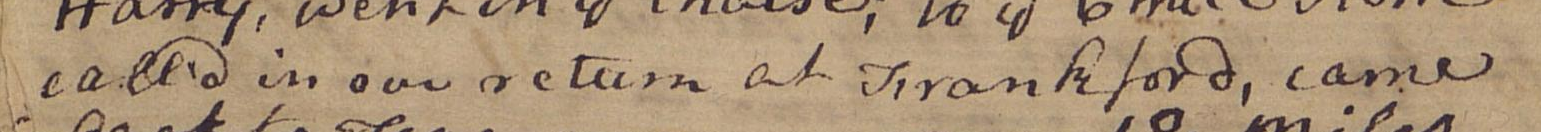call'd in our return at Frankford, came
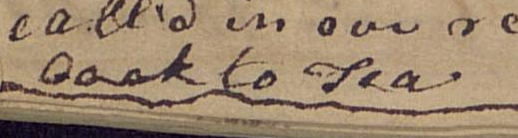back to Tea
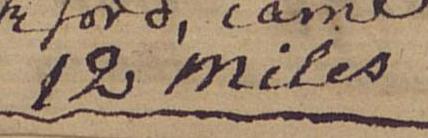12 Miles
